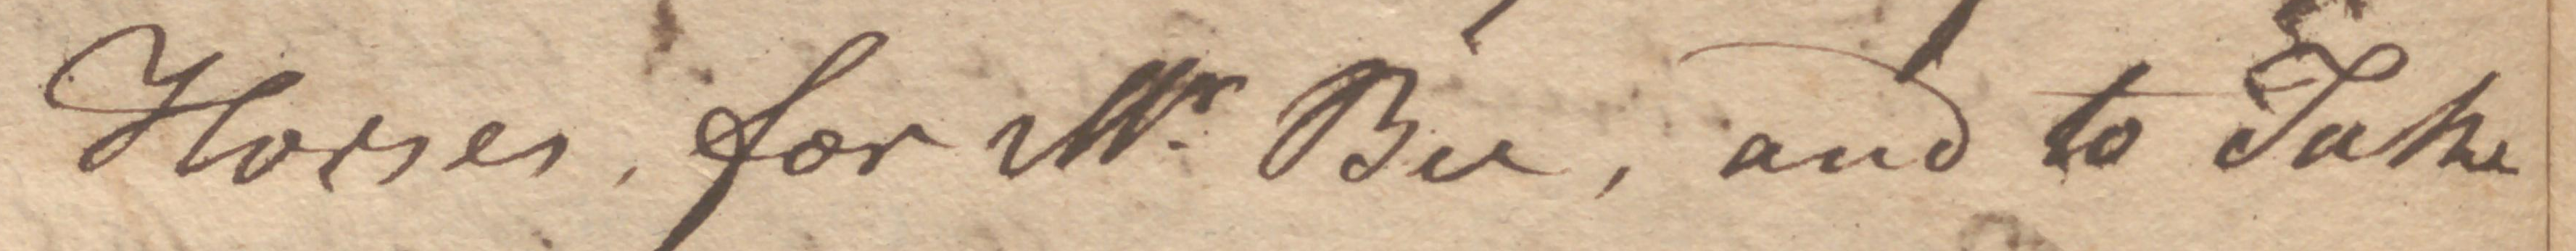Horses. for M^r. Bee, and to Take
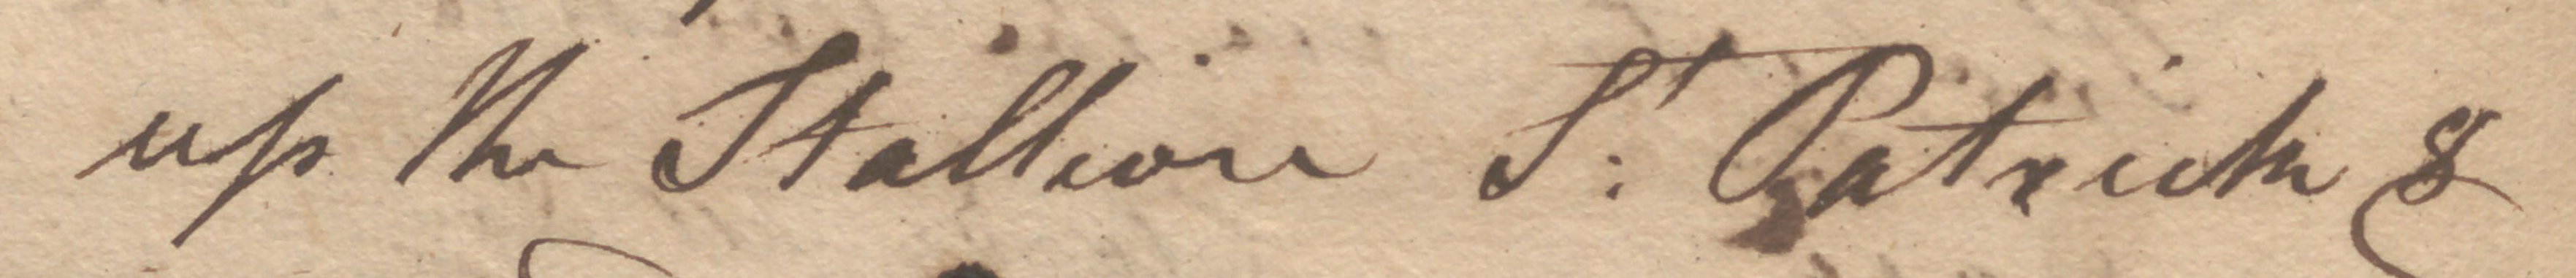up the Staltion S^t. Patrick 8
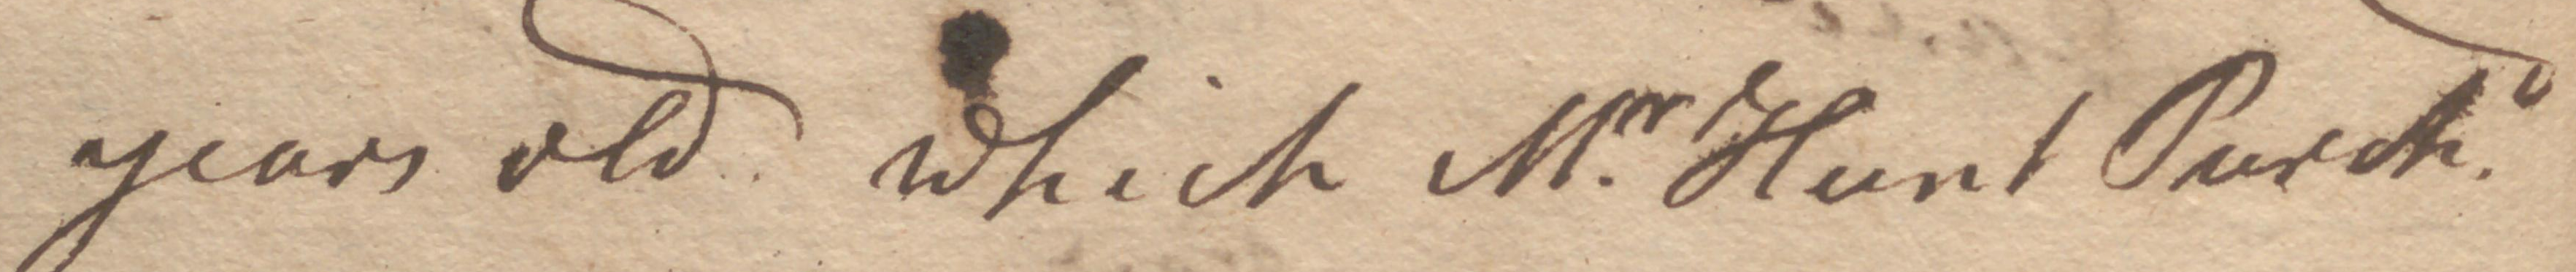years old. which M^r. Hunt Purch^d.
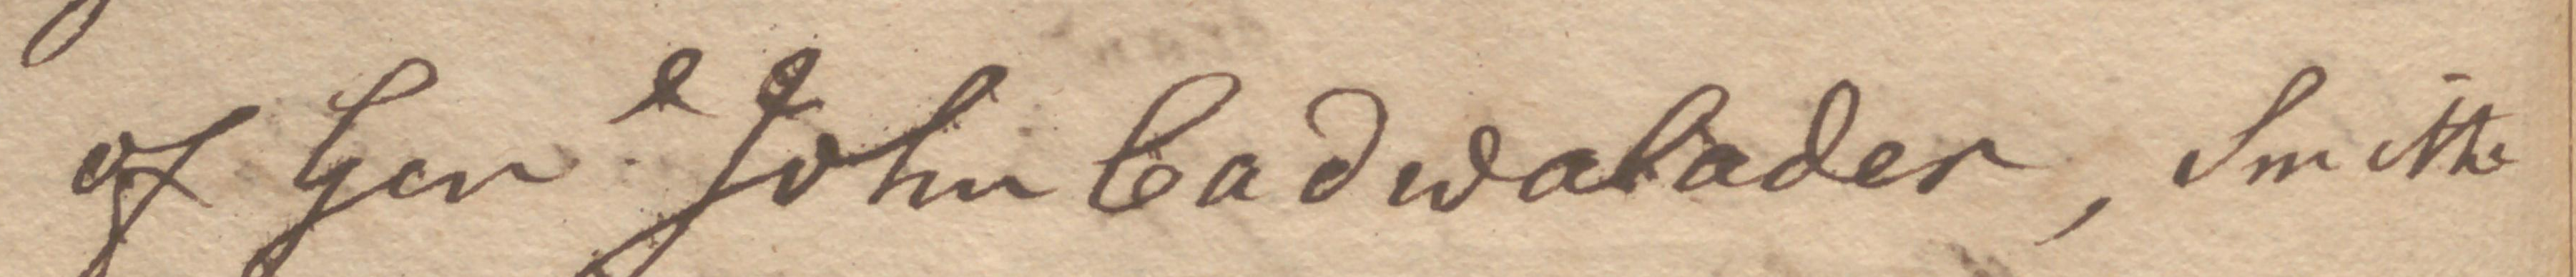of Gen^l. John Cadwalader, Smith
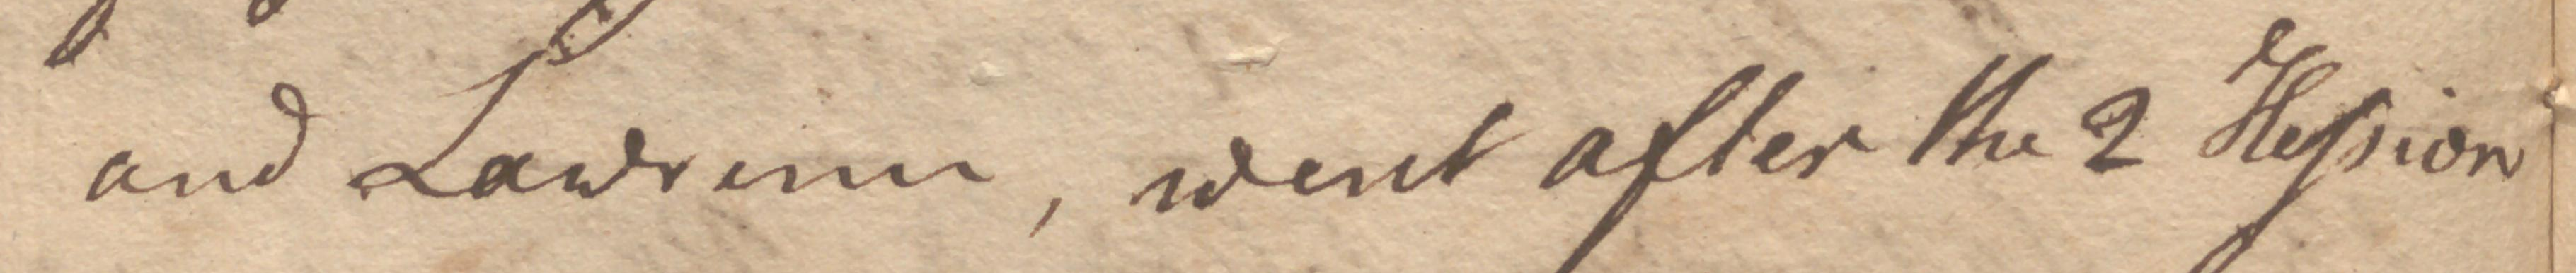and Lawrence, went after the 2 Hession
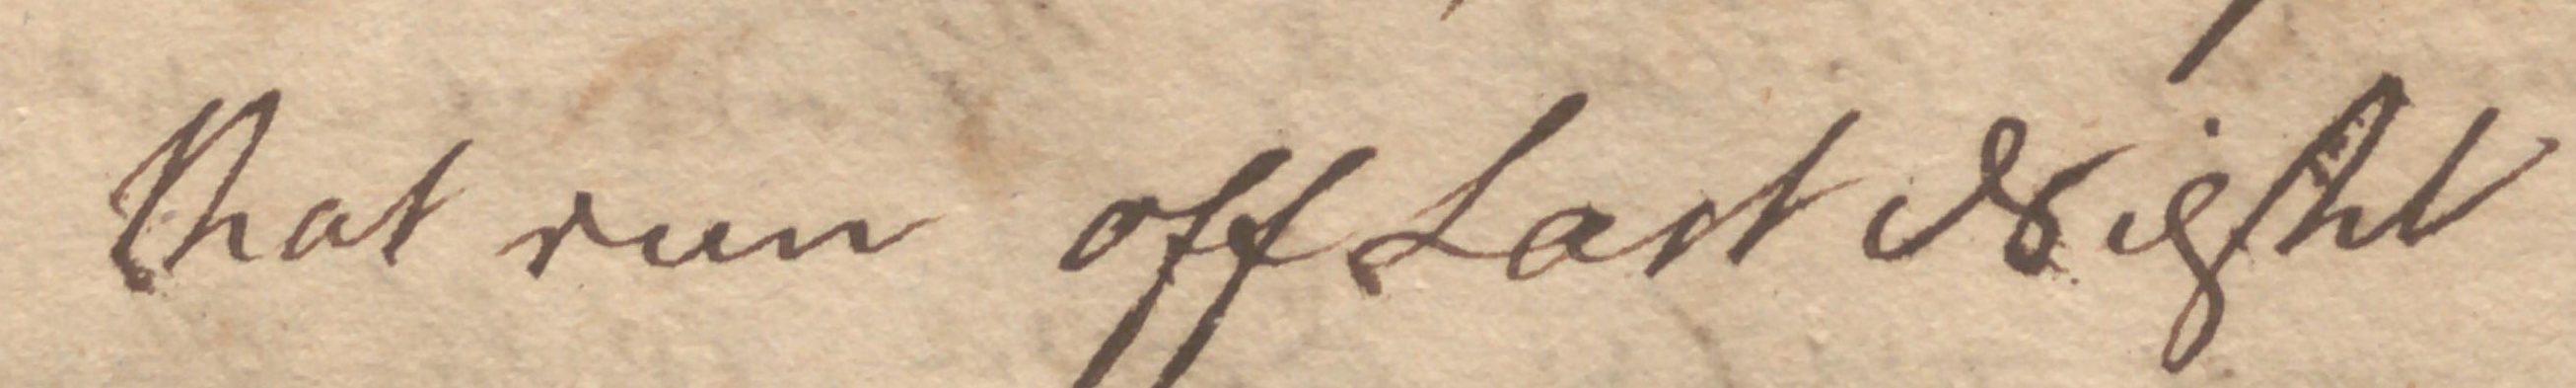that run off Last Night
